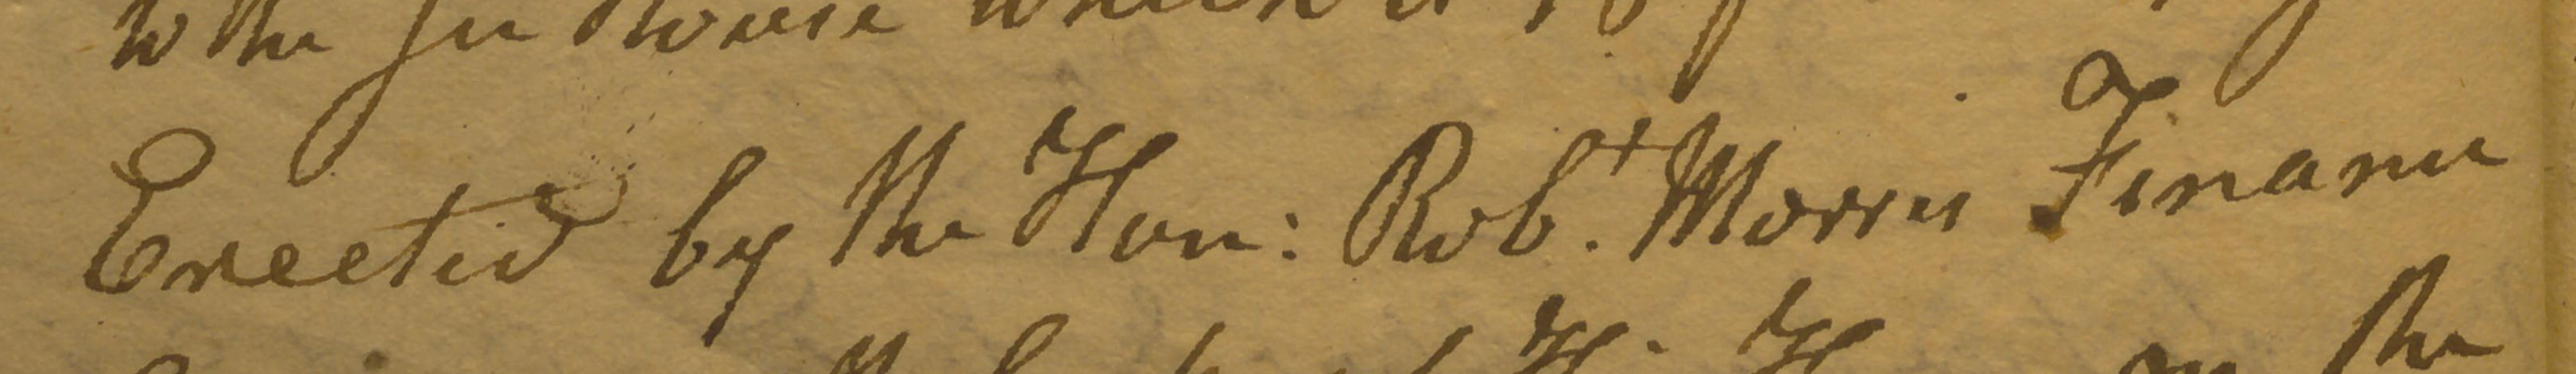Erected by the Hon: Rob^t. Morris Finance
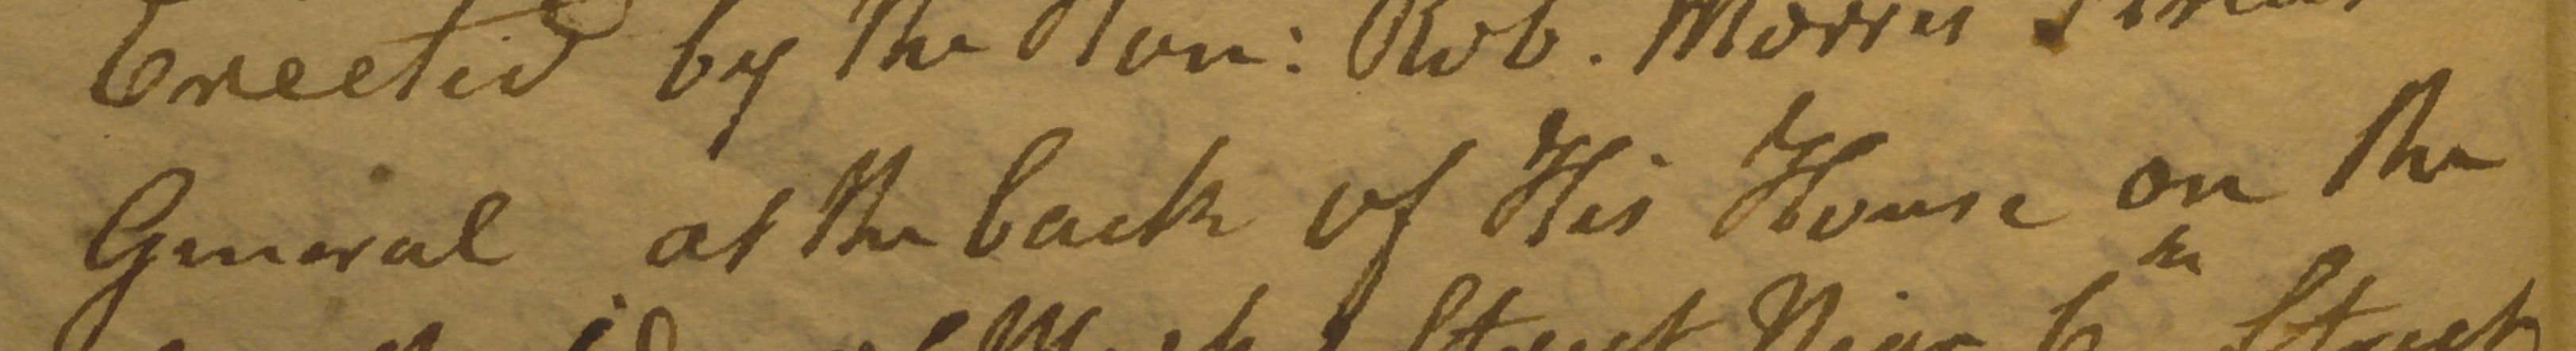General at the back of His House on the
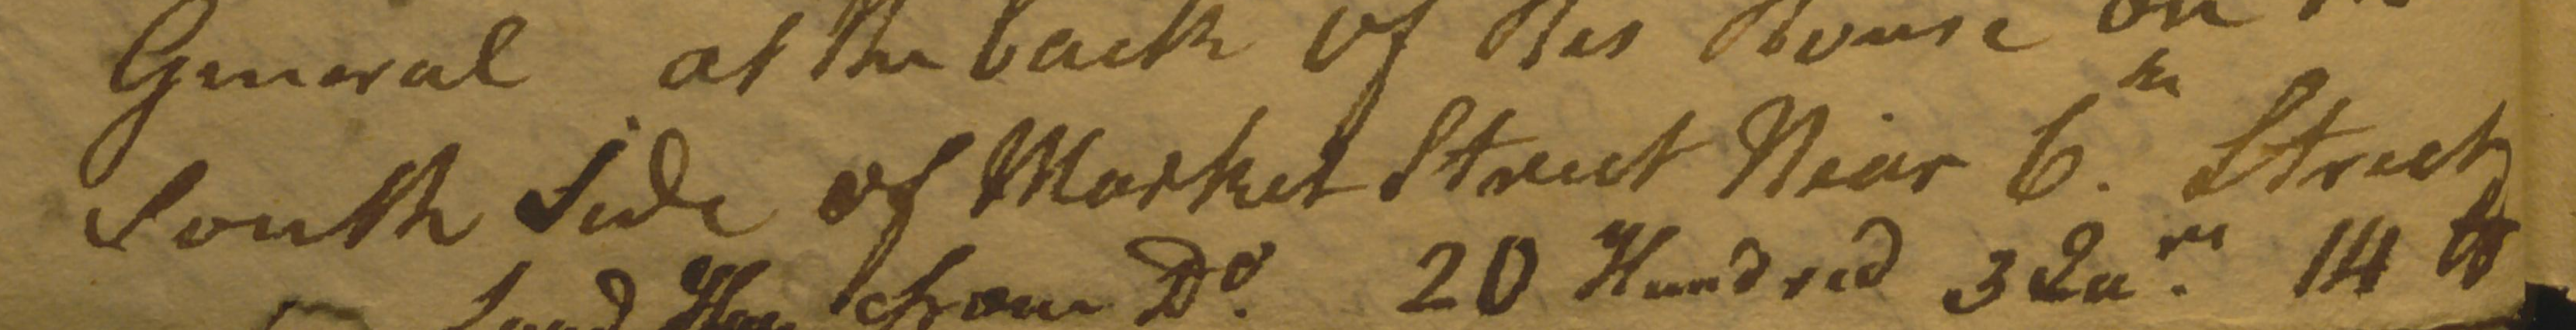South Side of Market Street Near 6^th. Street
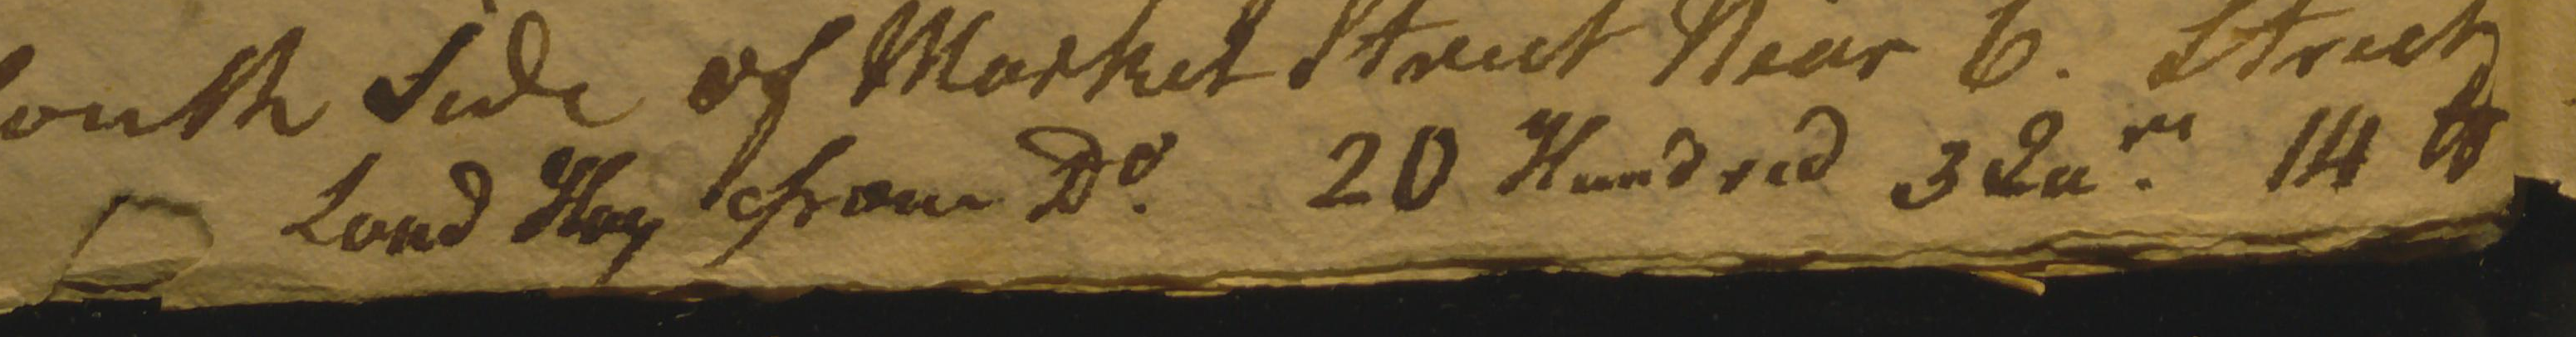Load Hay from D^o. 20 Hundred 3 Qu^rs. 14 lb
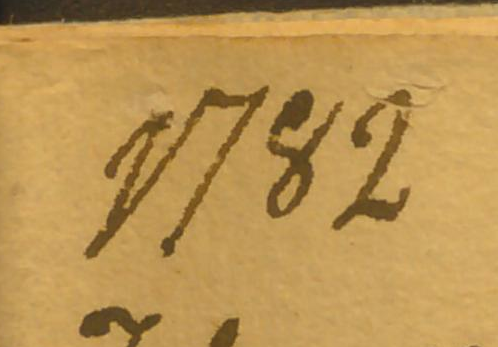1782
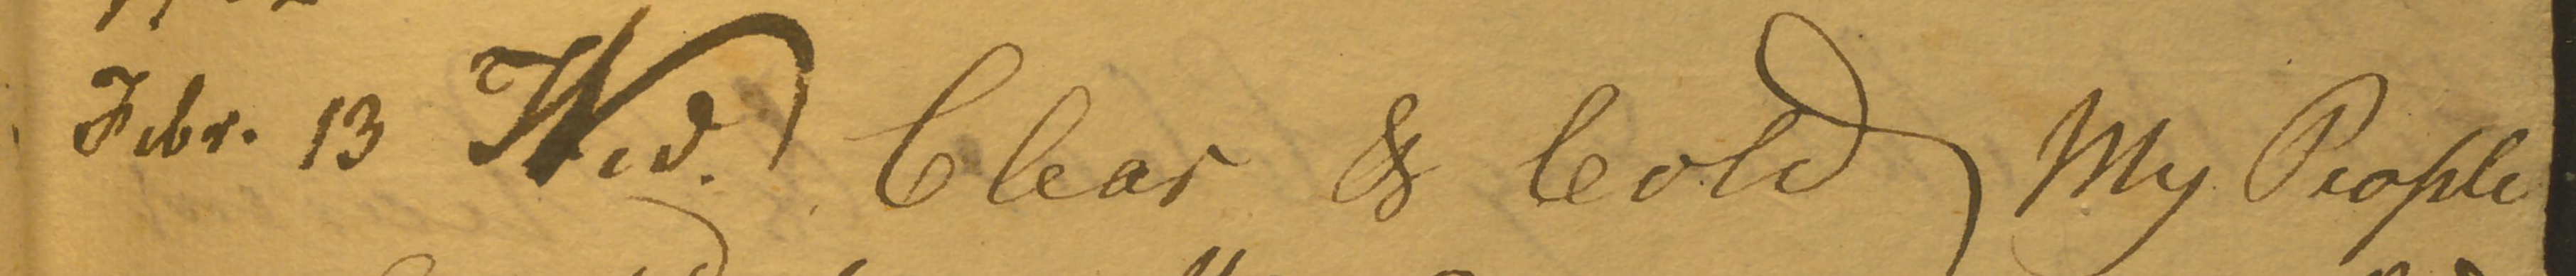Febr. 13 Wed. Clear & Cold My People
